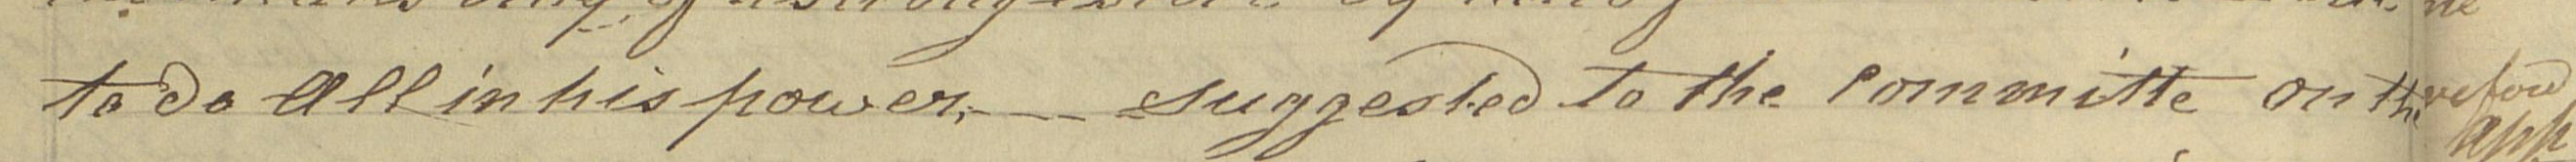to do All in his power, suggested to the committe on the
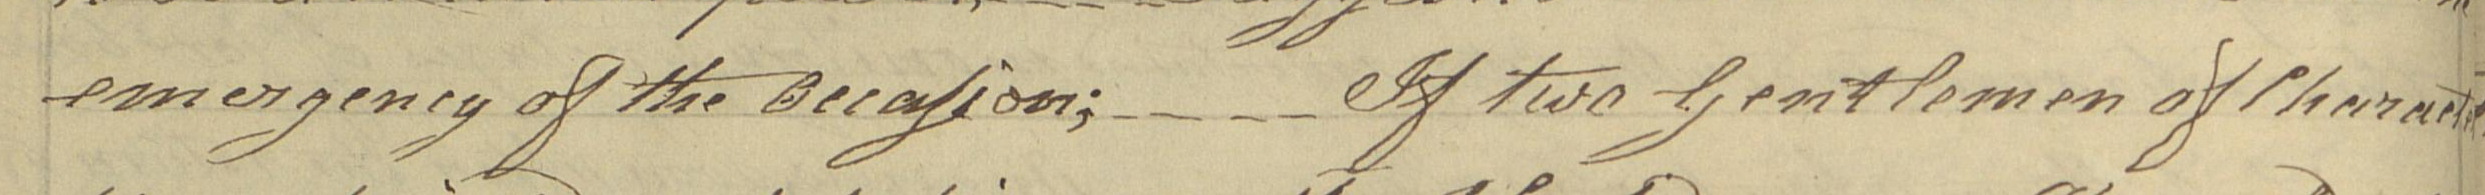emergency of the occasion; If two Gentlemen of Charact-
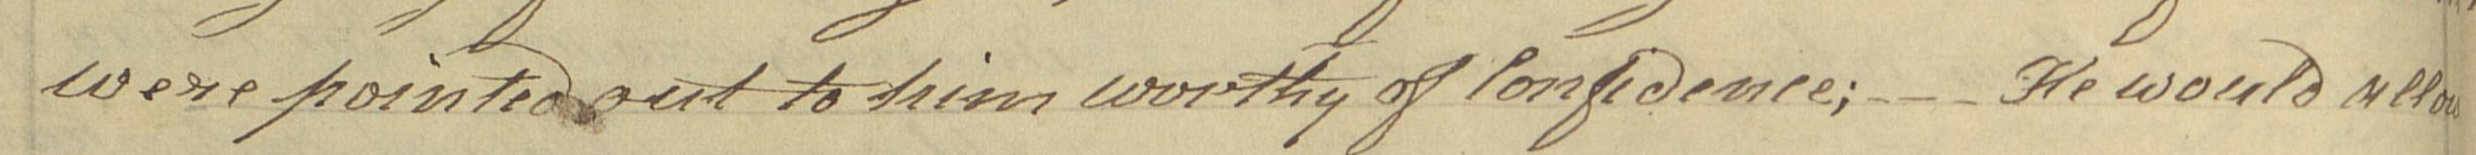were pointed out to him worthy of Confidence; He would allow
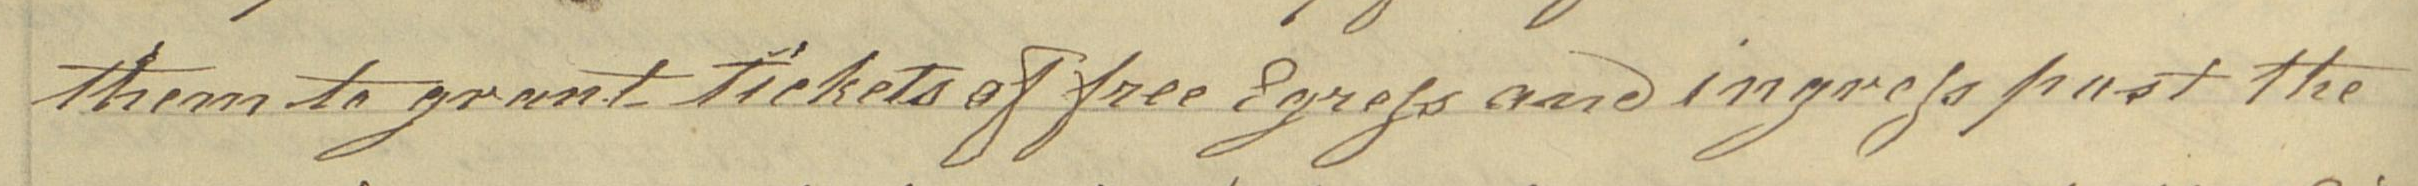them to grant tickets of free Egress and ingress past the
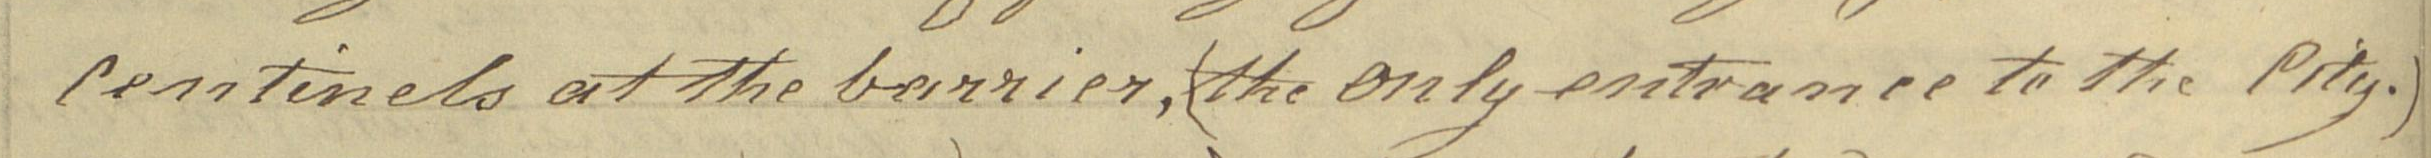centinels at the barrier, (the only entrance to the City.)
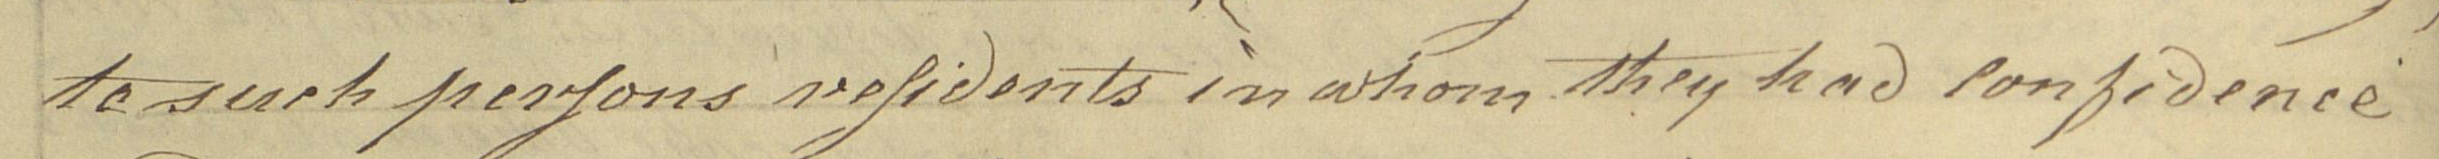to such persons residents in whom they had confidence
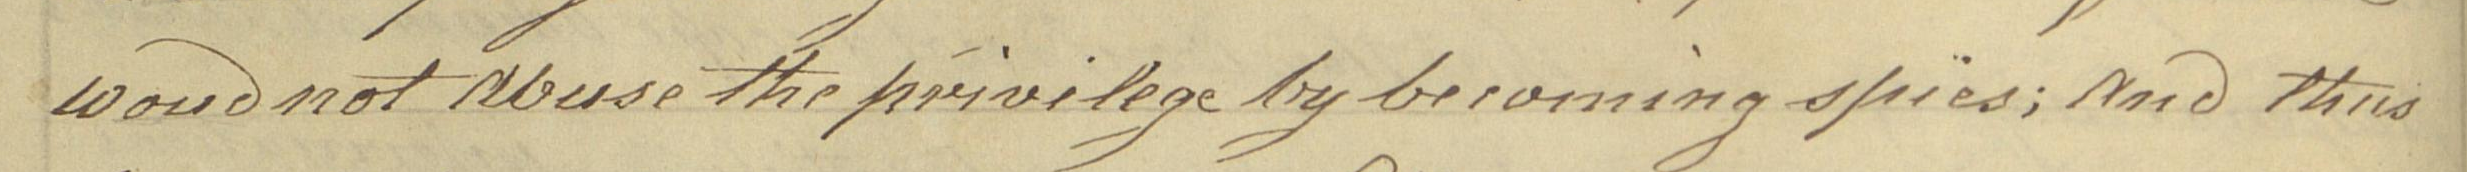woud not abuse the privilege by becoming spies; and thus
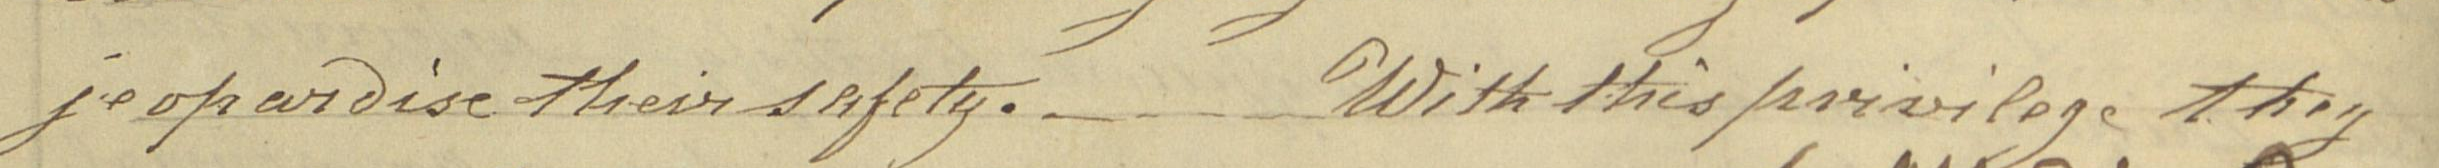jeopardise their Safety. With this privilege they
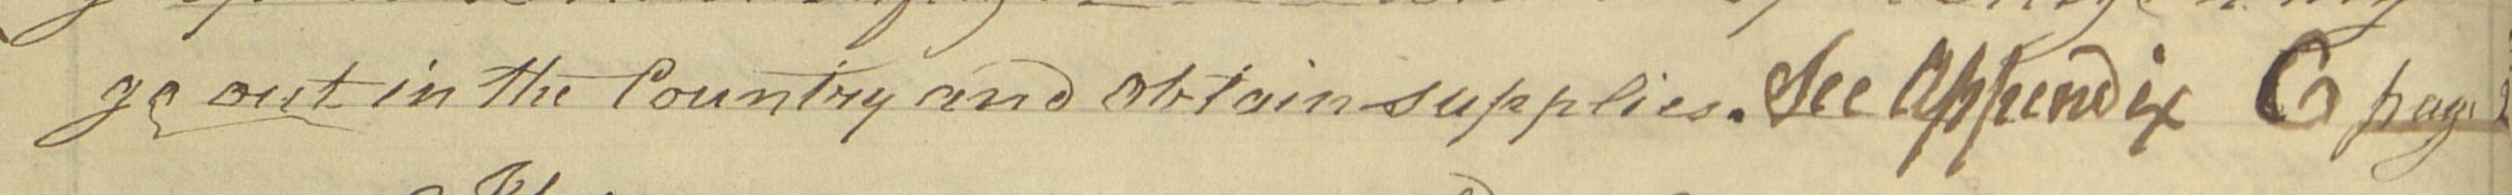go out in the Country and Obtain supplies. See Appendix C page
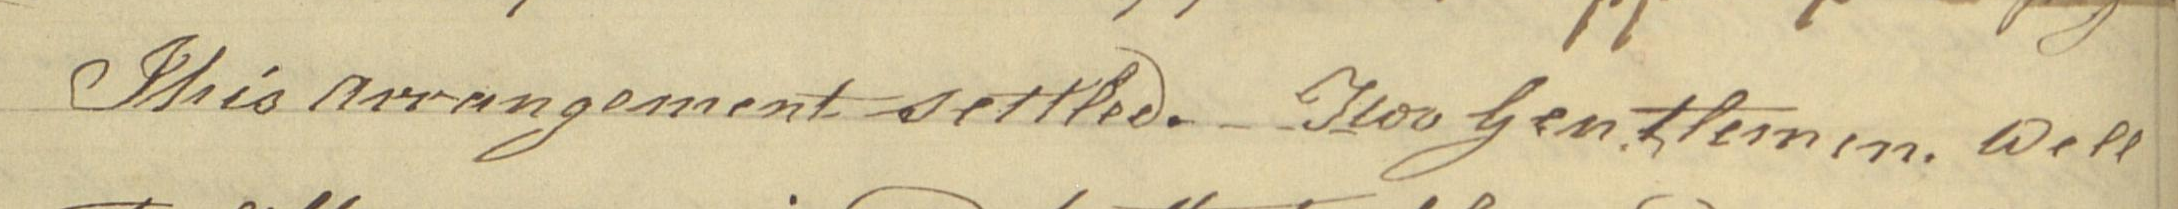This arrangement settled. Two Gentlemen. Well
